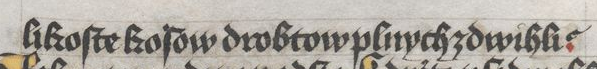likoſte koẛow drobtow plnych zdwihli?
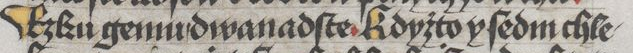Rzku gemu.dwanadſte.Kdyżto y ſedm chle¬
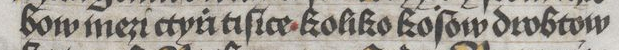bow mezí ctyṙi tiſice.koliko koſow drobtow
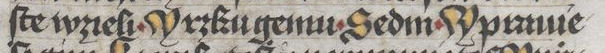ſte wzieli.Y rzku gemu Sedm Yprauie¬
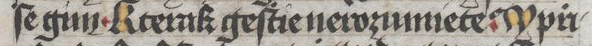ẛe gim.Kterak geẛtie nerozumete?Y pṙi¬
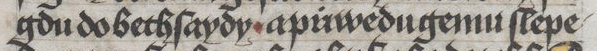gdu do bethſaydy.a pṙiwedu gemu ſlepe¬
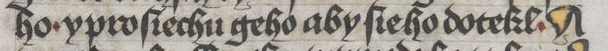ho.y proſíechu geho aby ſieho dotekl.A
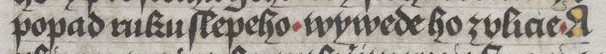popad ruku ſlepeho.wywede ho zvlicie.A
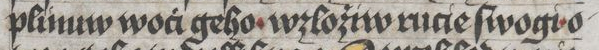plinuw woċi geho.wzložiw rucie ſwogi.o¬
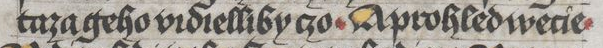taza geho vidielliby czo.A prohled wecie.
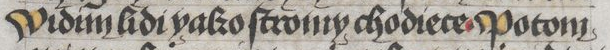Vidrn lidi yako ſtromy chodiece.Potom
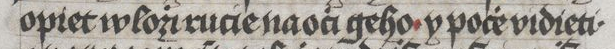opiet wlożi rucie na oċi geho.y poċe vidieti.
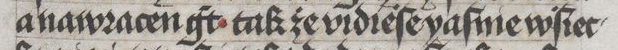a nawracen ḡt.tak że vidíeẛe yaſnie wẛiec¬
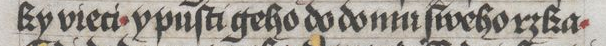ky vieci.y puſti geho do domu ſweho rzka.
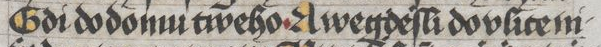Gdi do domu tweho.A wegdeẛli do vlice ni¬
